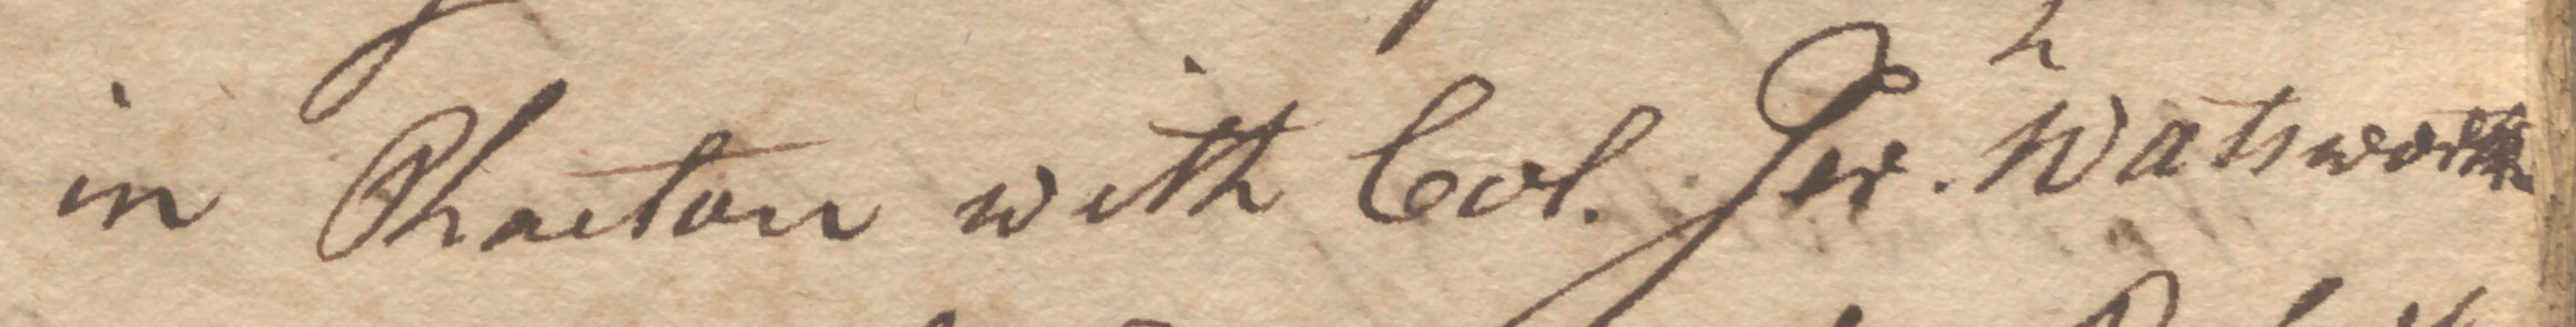in Phaeton with Col. Jer^h. Watsworth
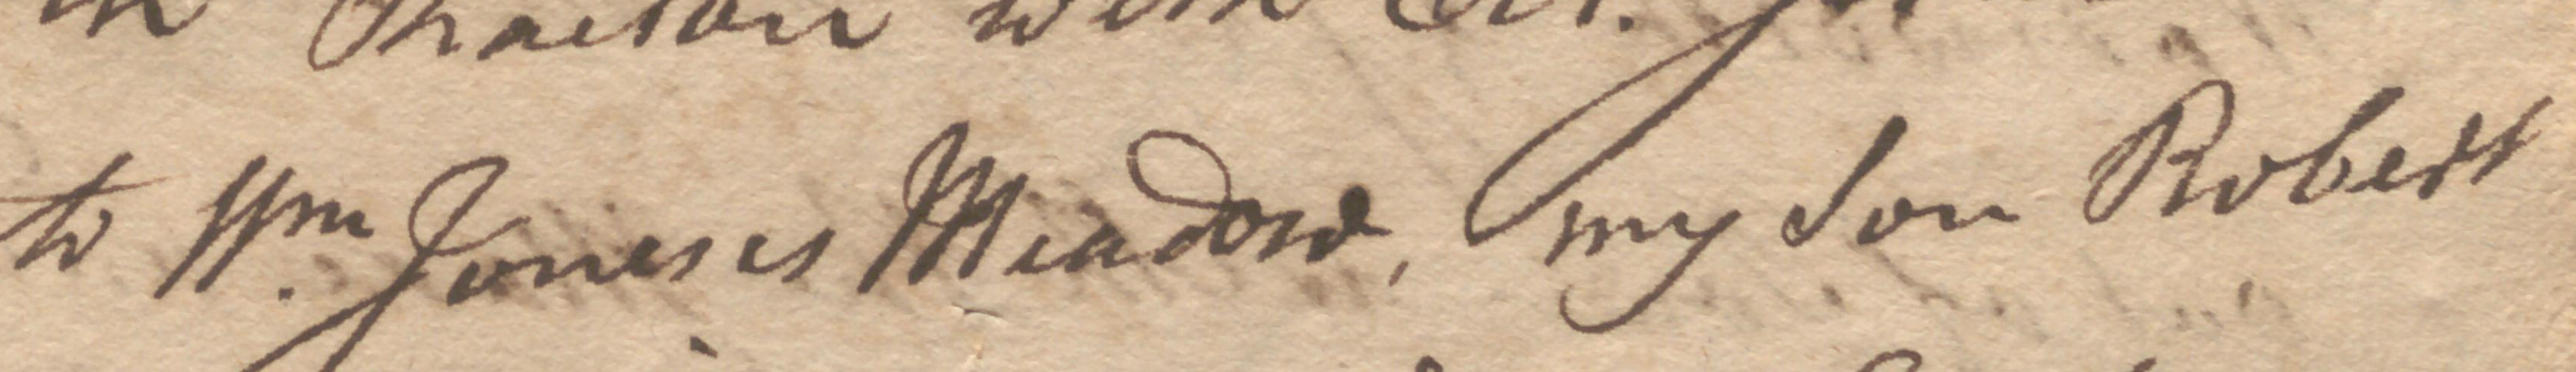t W^m. Joneses Meadow, my Son Robers
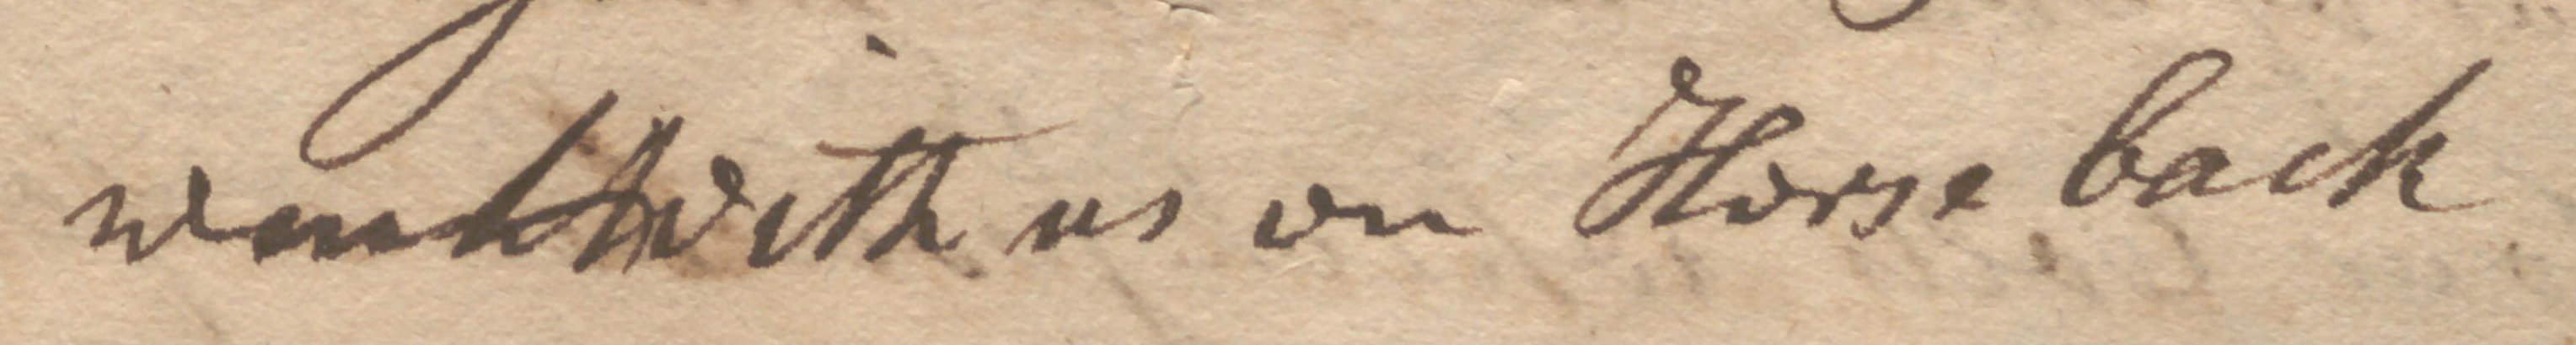went with us on Horse back
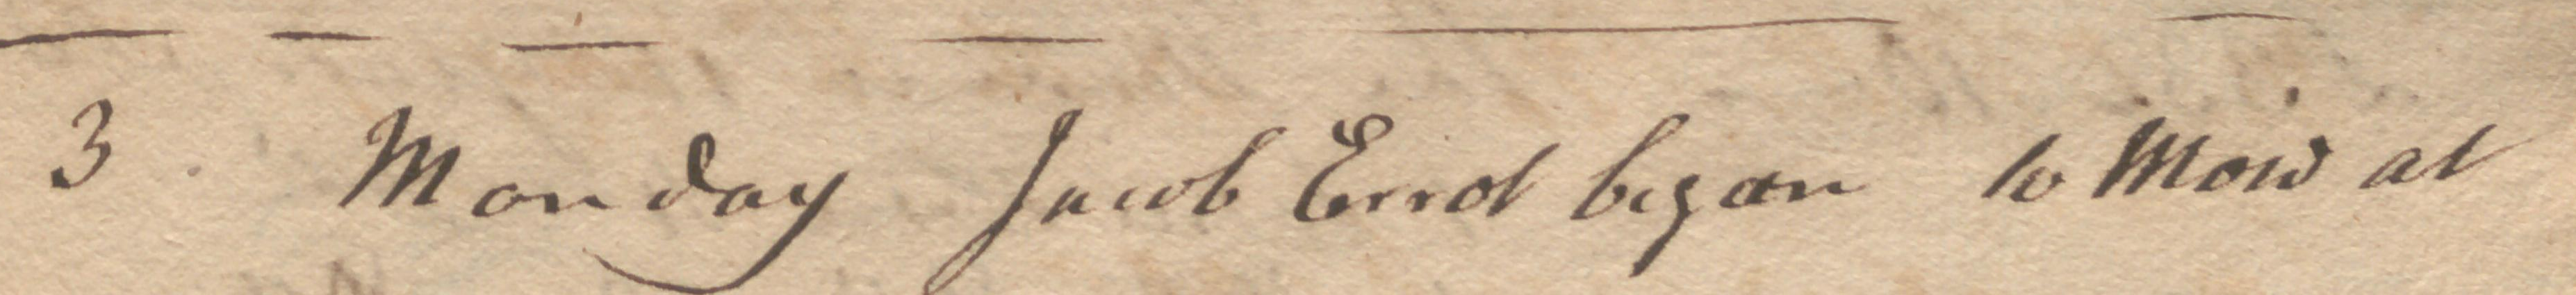3. Monday Jacob Errol began to Mow at
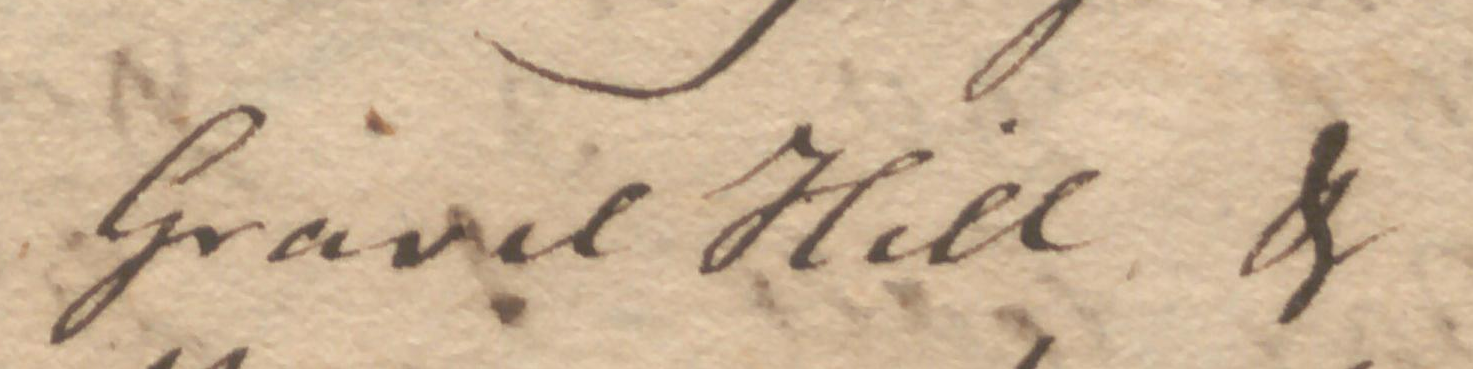Gravel Hill, &
